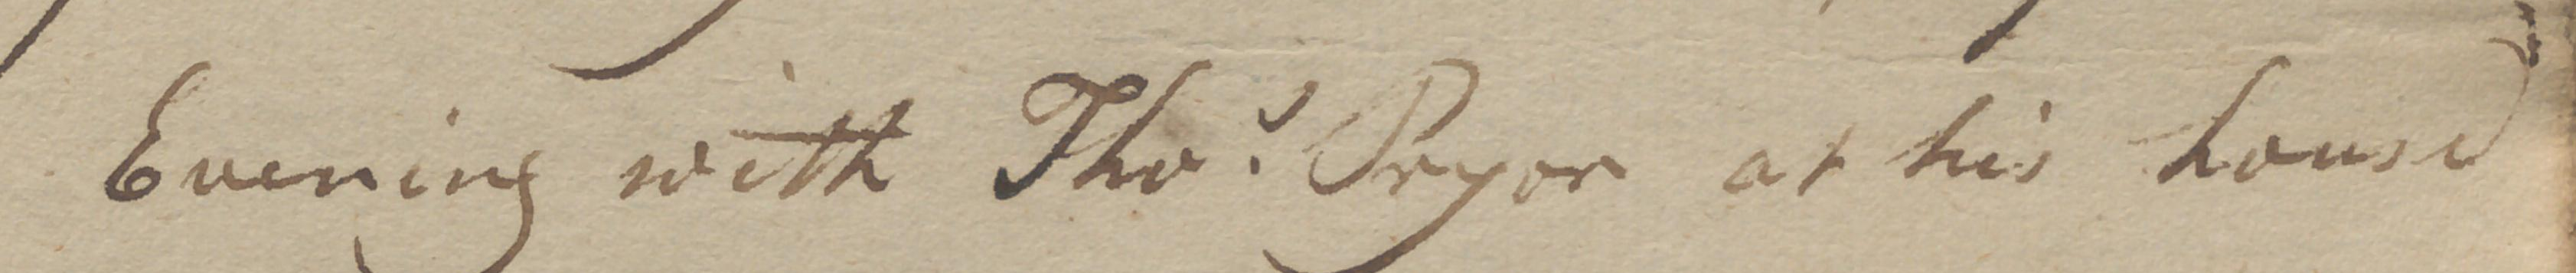Evening with Tho^s. Pryor at his house
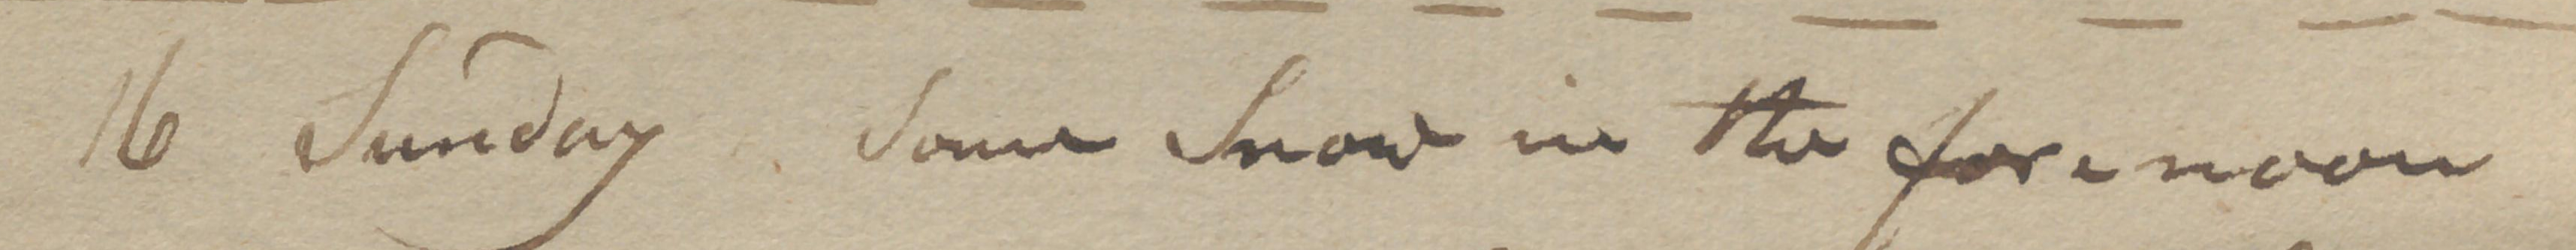16 Sunday Some Snow in the forenoon
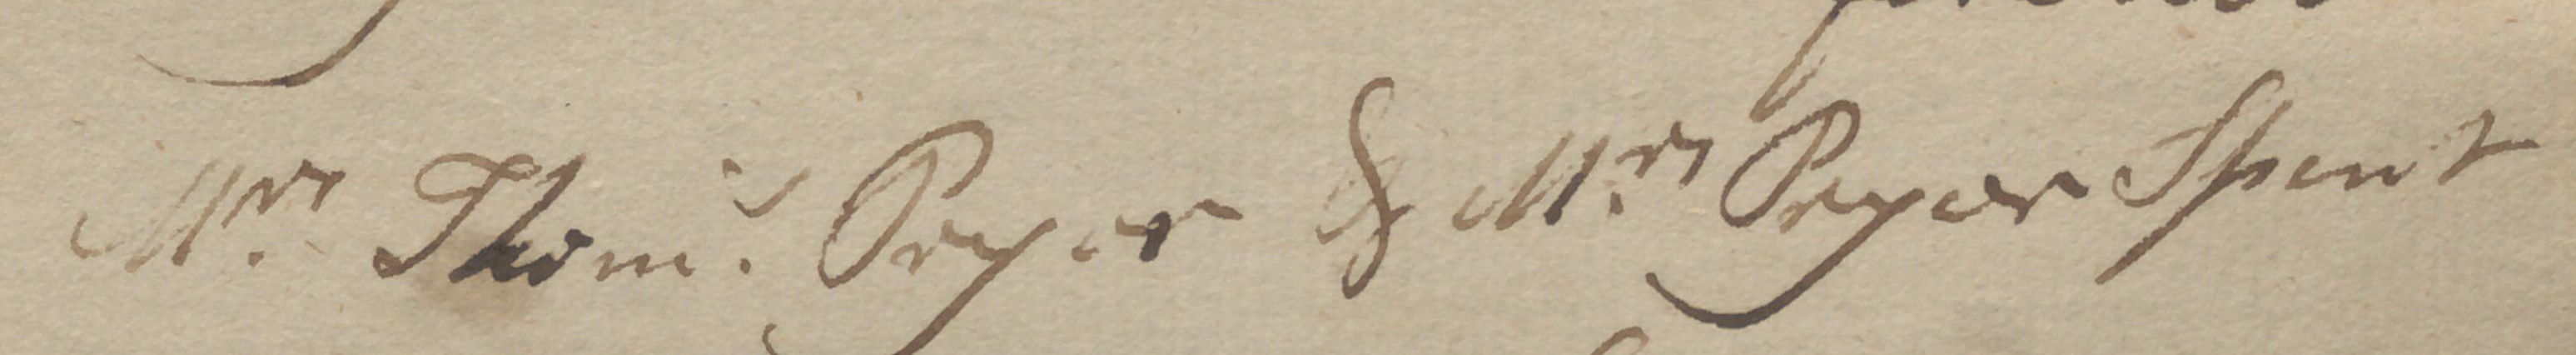M^r. Thom^s. Pryor & M^rs. Pryor Spent
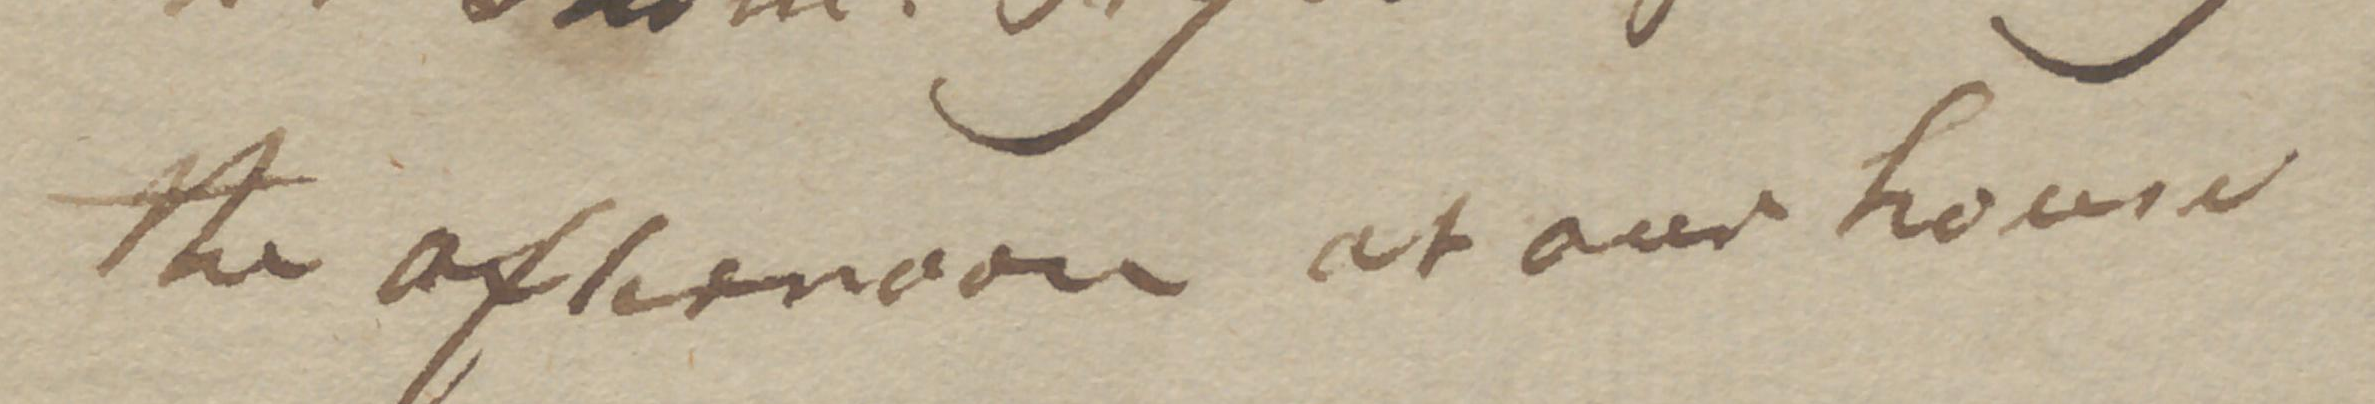the afternoon at our house
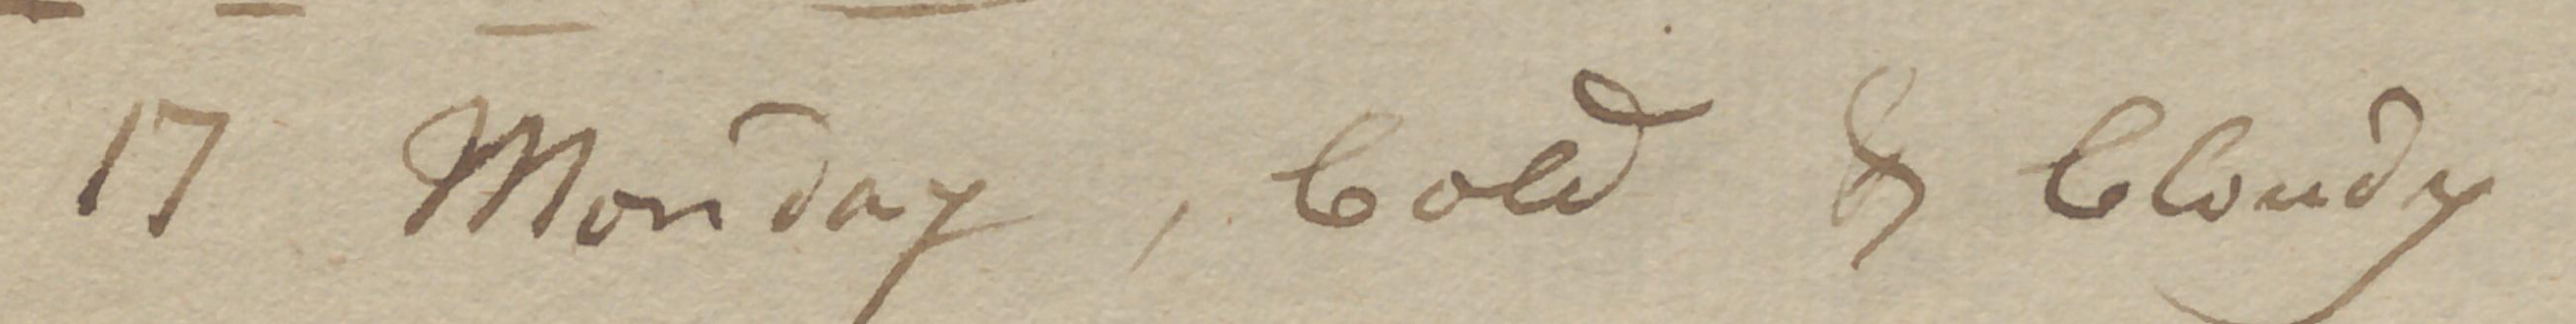17 Monday, Cold & Cloudy
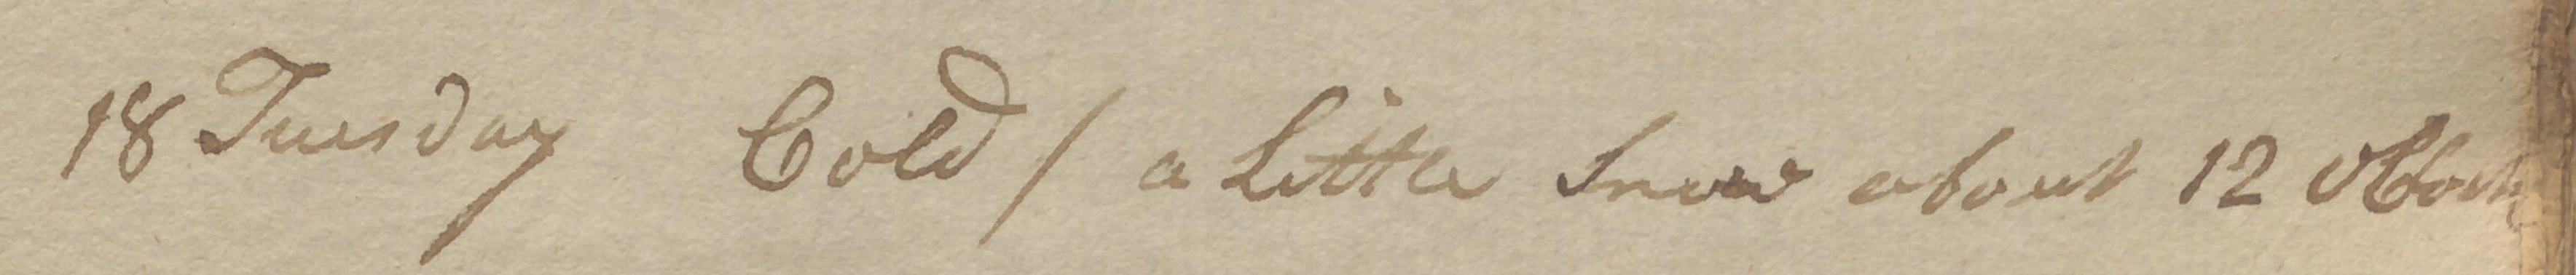18 Tuesday Cold / a Little snow about 12 oClock
